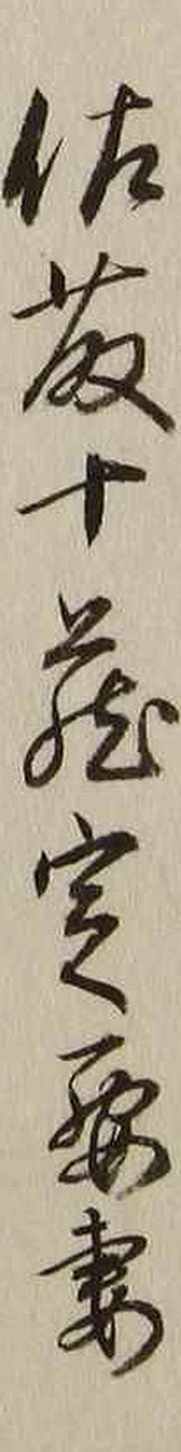佐藤十蔵定要妻
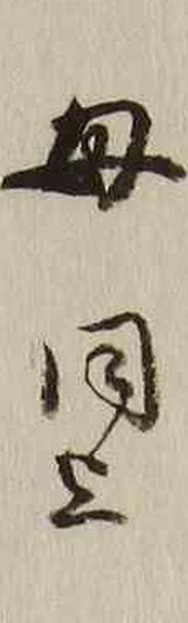母同上
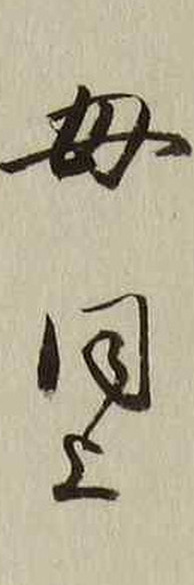母同上
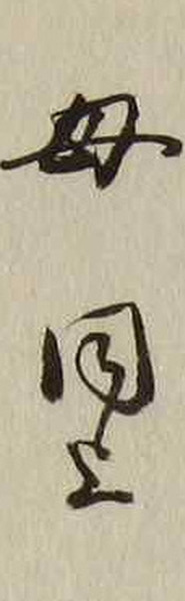母同上
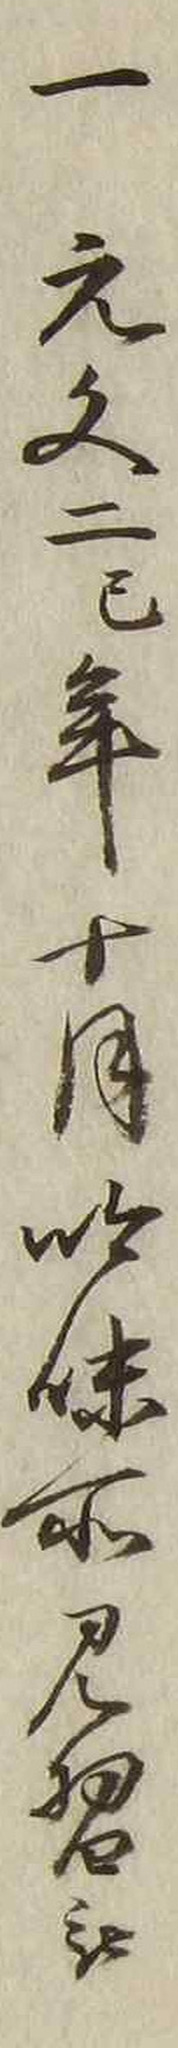一元文二巳年十月吟味所見習被
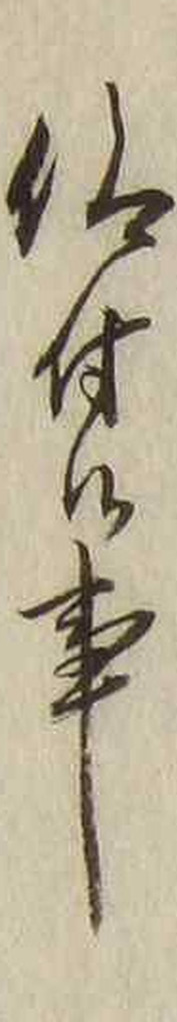仰付候事

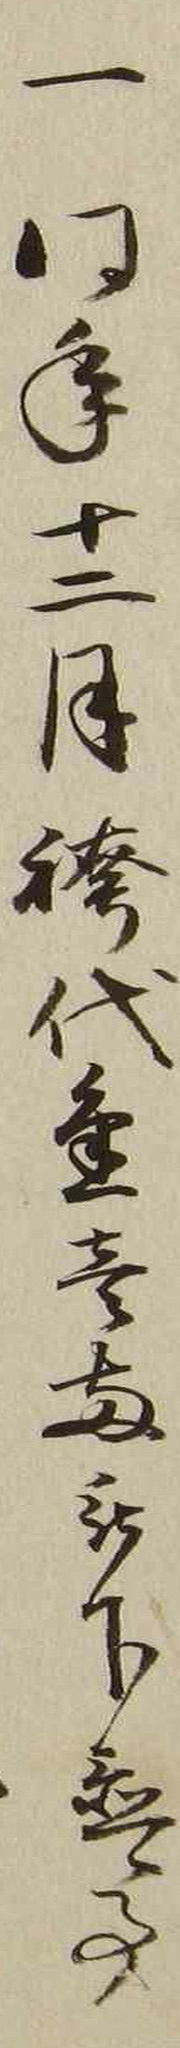一同年十二月袴代金壱両被下置候事
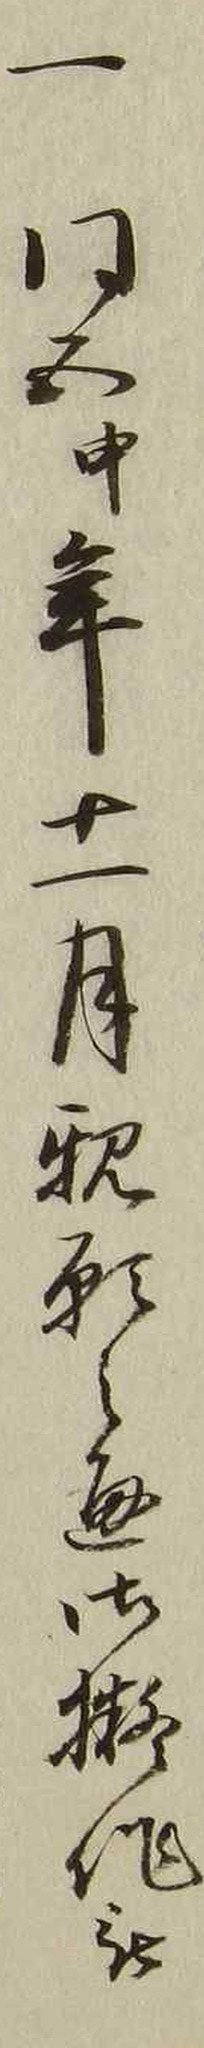一同五申年十一月親願之通御擬作被
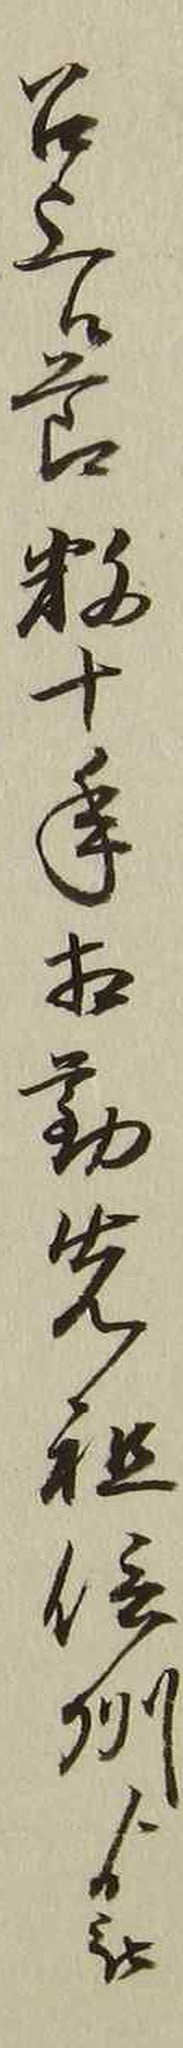召上候節数十年相勤先祖信州ゟ被
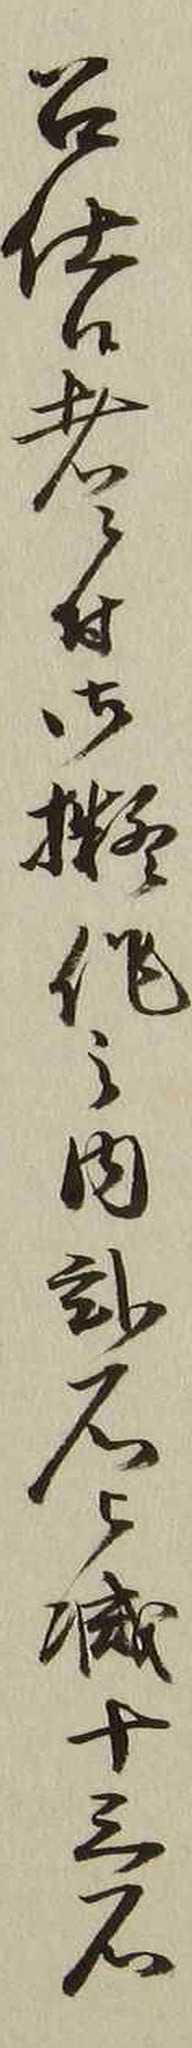召仕候者ニ付御擬作之内弐石被減十三石
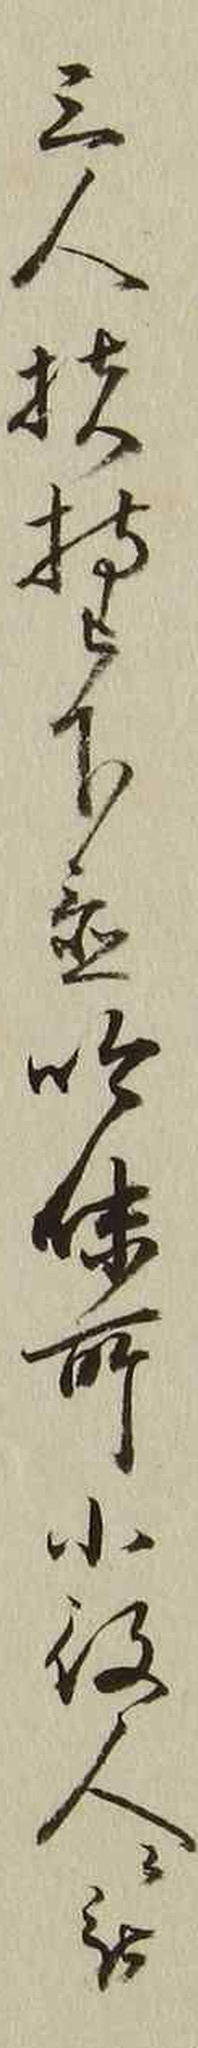三人扶持被下置吟味所小役人ニ被
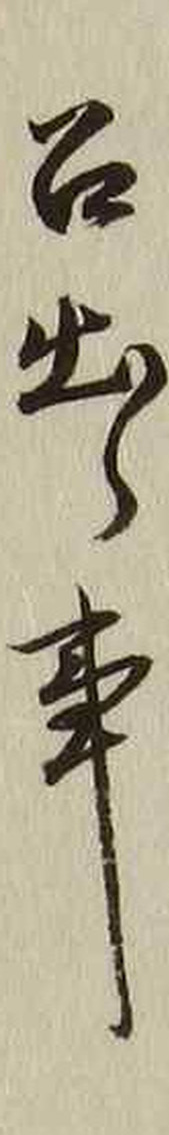召出候事
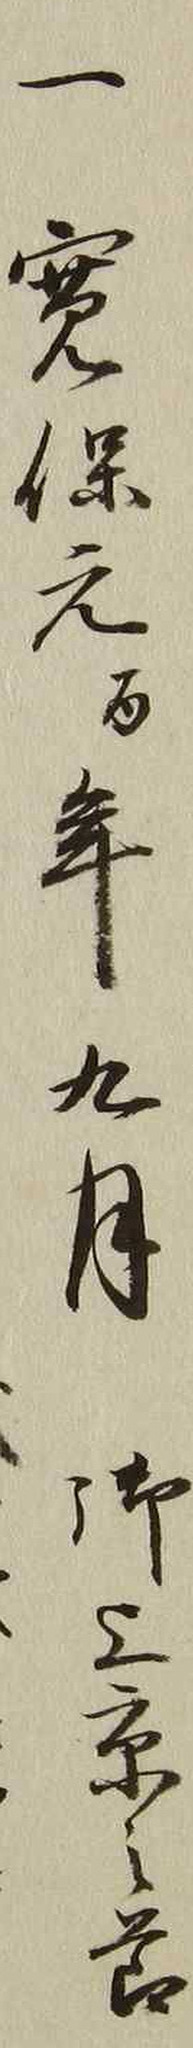一寛保元酉年九月御上京之節
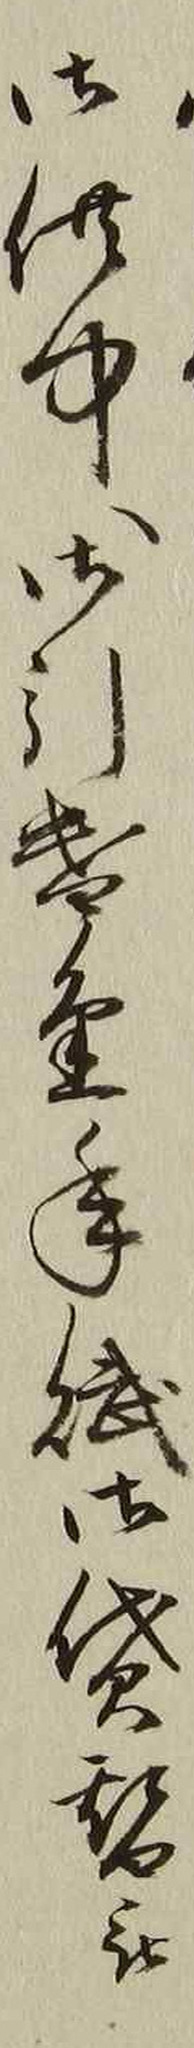御供中へ御引替金年賦御貸替被
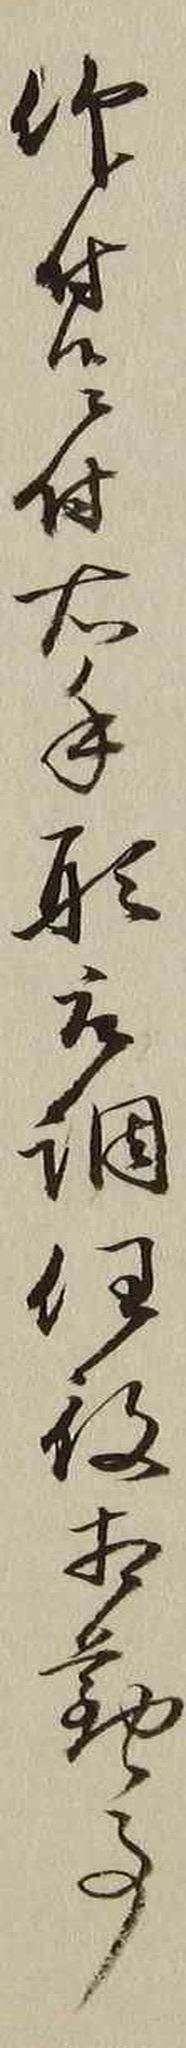仰付候ニ付右手形取調任役相勤候事
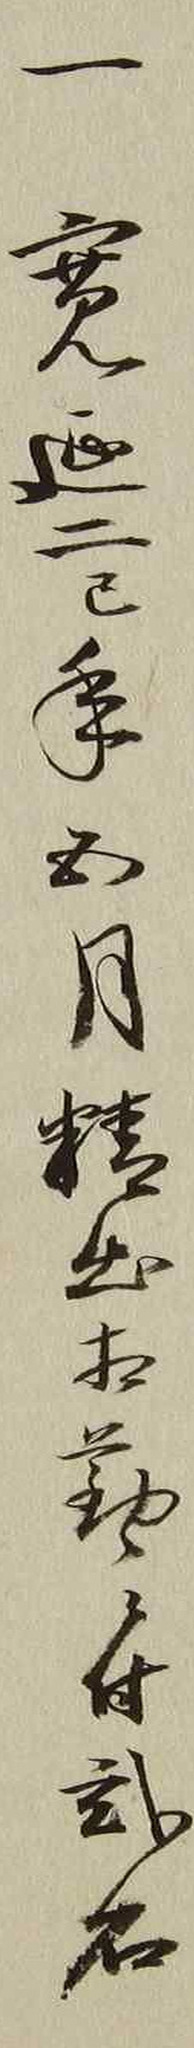一寛延二巳年五月精出相勤候ニ付弐石
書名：諸士系譜　巻之102　か之部10
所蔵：会津若松市立会津図書館
